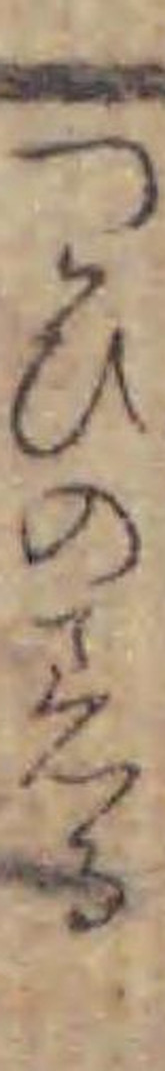つかひの着る
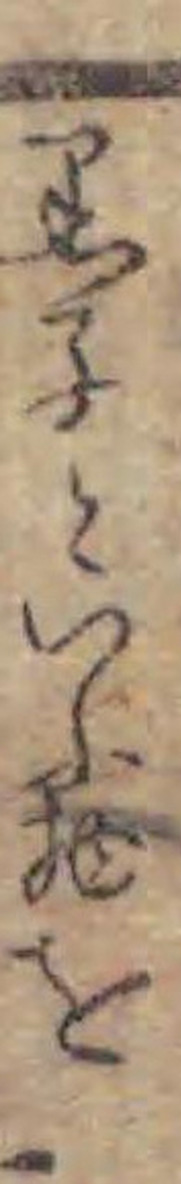黒子といふ物を
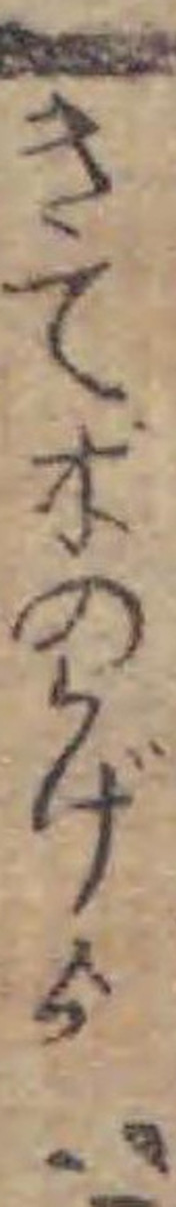きて木のかげより
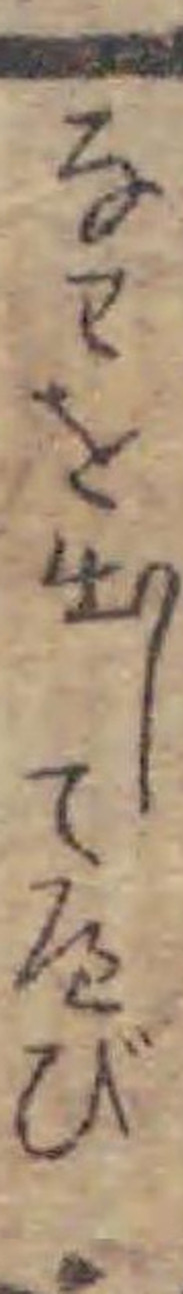なわを出してへび
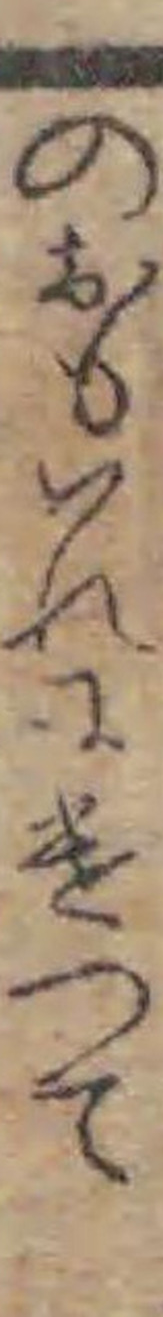のおもいれに遣つて
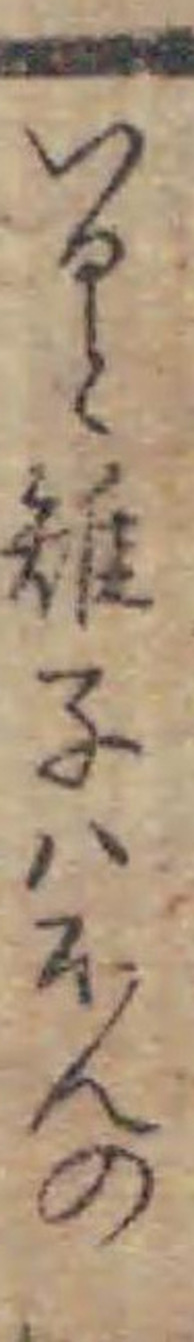いると雉子はほんの
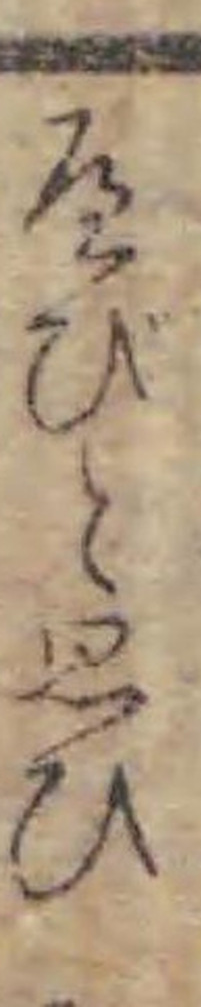へびと思ひ
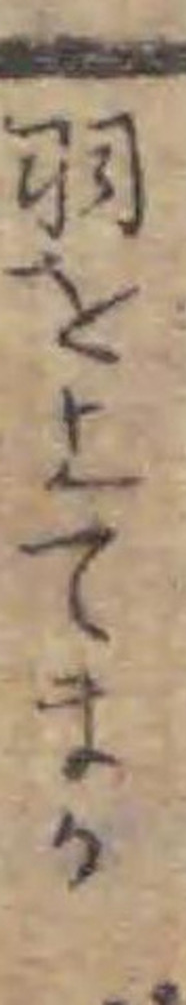羽を上てまか
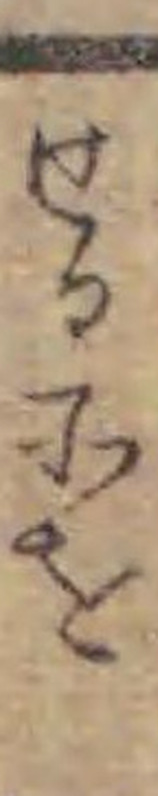せる所を
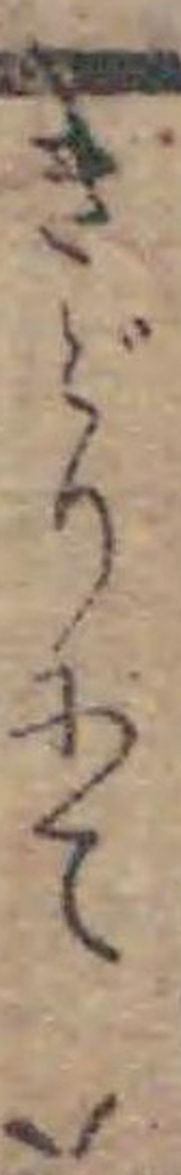きどりにて
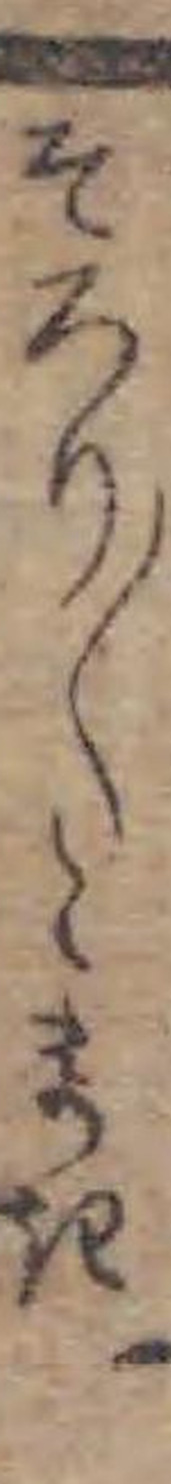そろり〳〵とまき
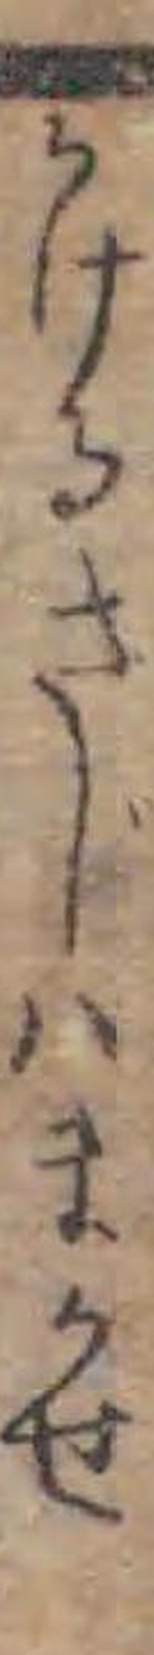かけるきじはまかせ
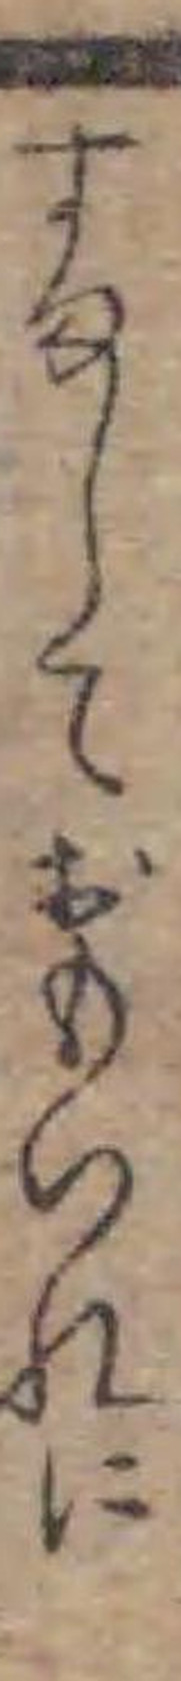すましておもいれに
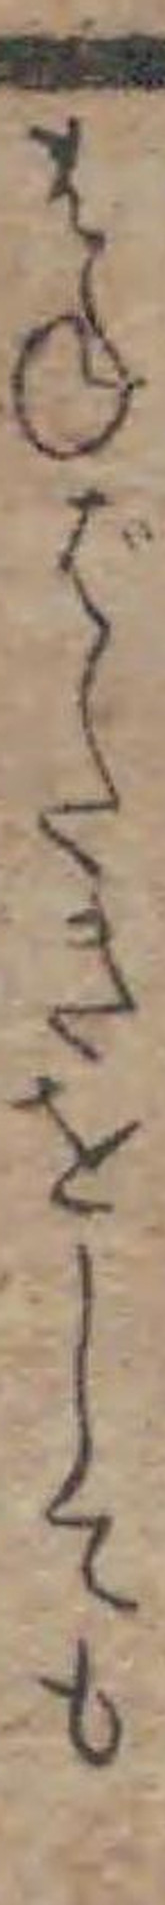はねばたきをしても
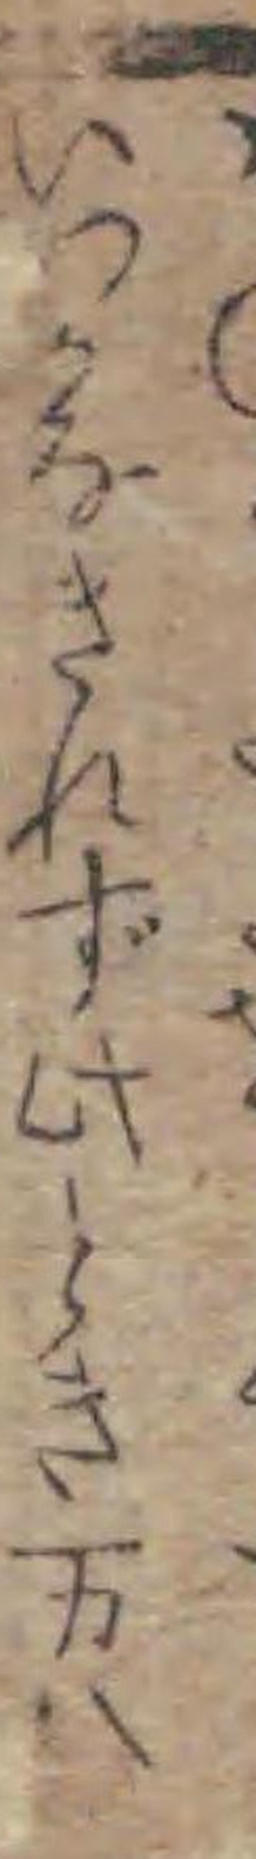いつかなきれず此とき万八
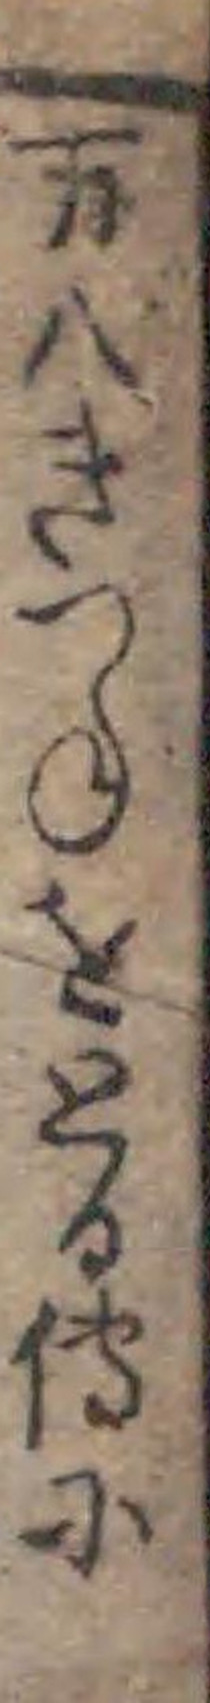万八きつねをとる伝に
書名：虚言八百万八伝 : 3巻
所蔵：国立国会図書館 National Diet Library, JAPAN
